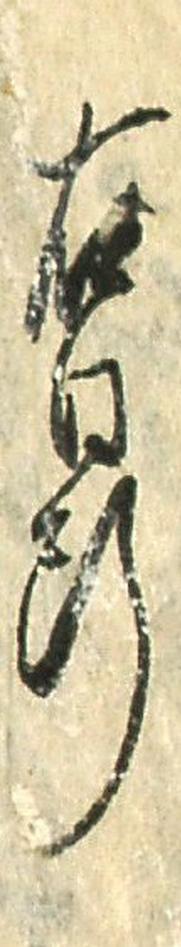右同断
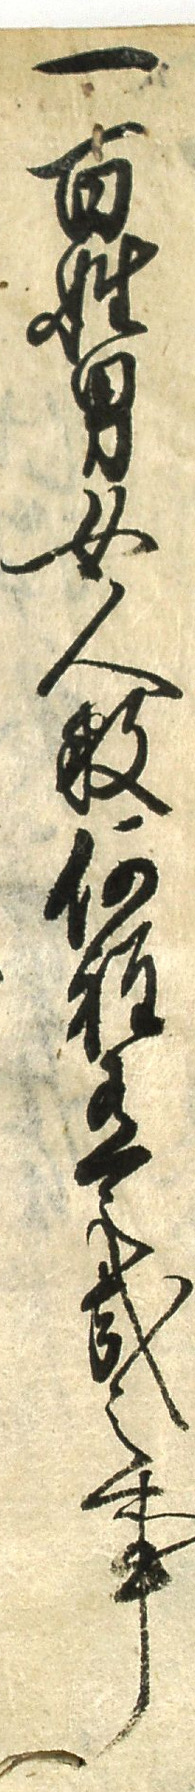一百姓男女人数何程有之哉之事
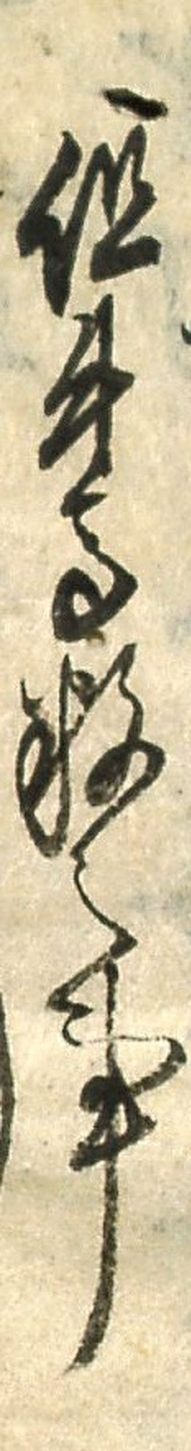但牛馬数之事
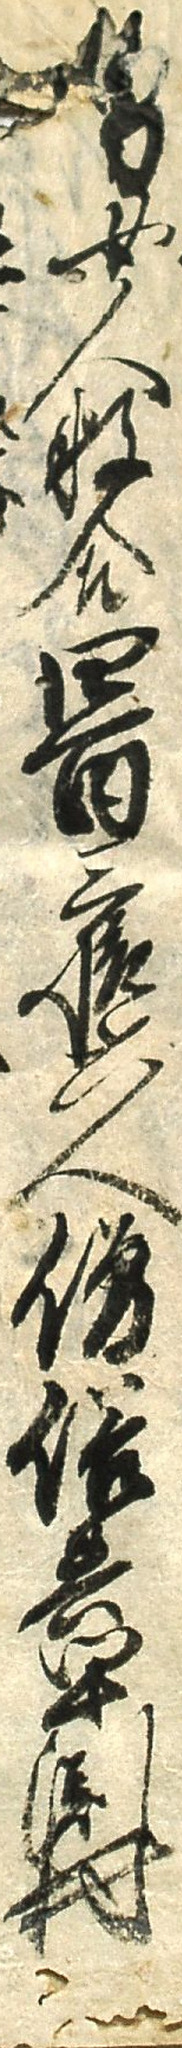男女人数合四百三拾六人僧俗共早渕村
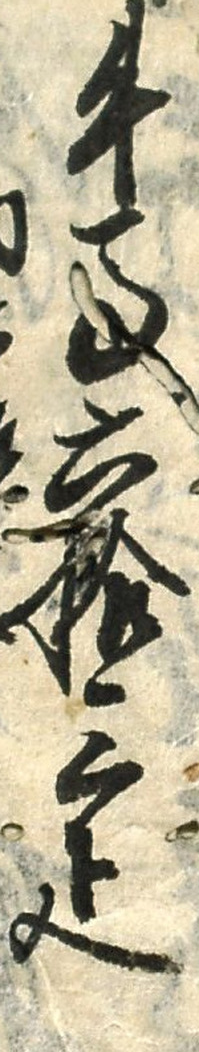牛馬六拾三疋
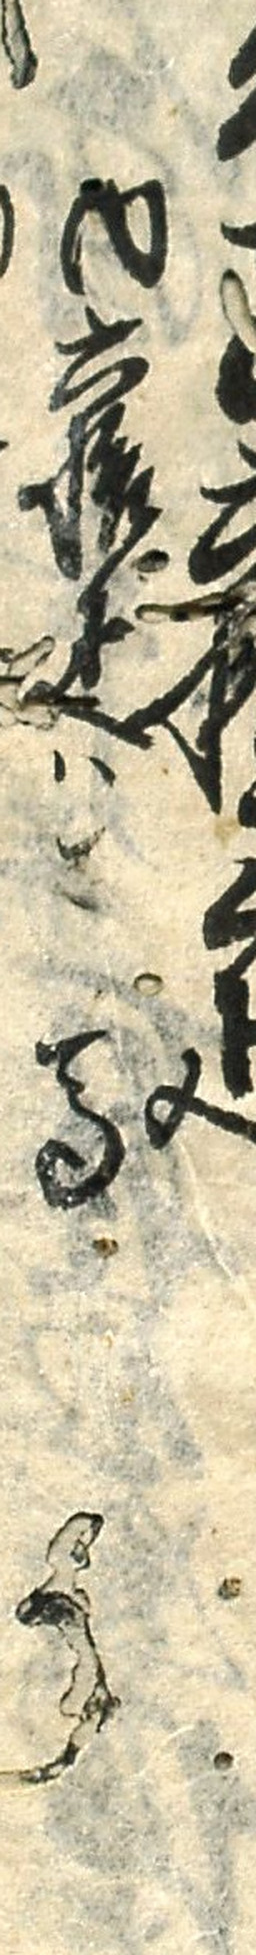内六拾疋ハ馬
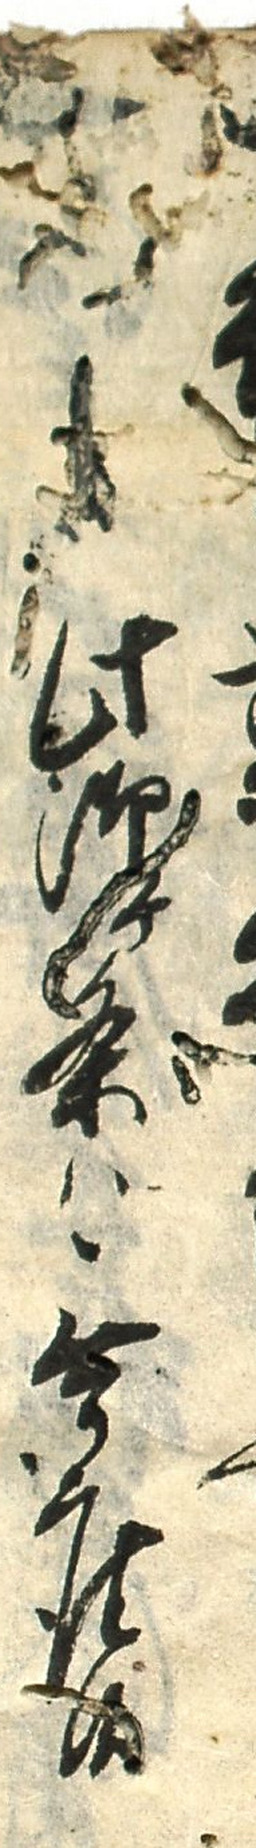此御ヶ条ハ無御座候
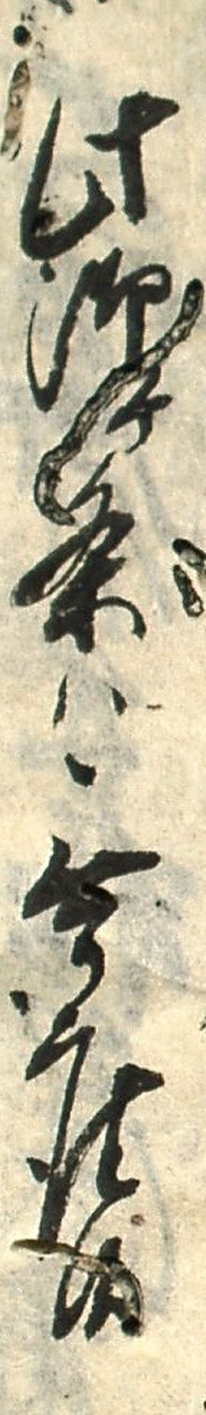此御ヶ条ハ無御座候
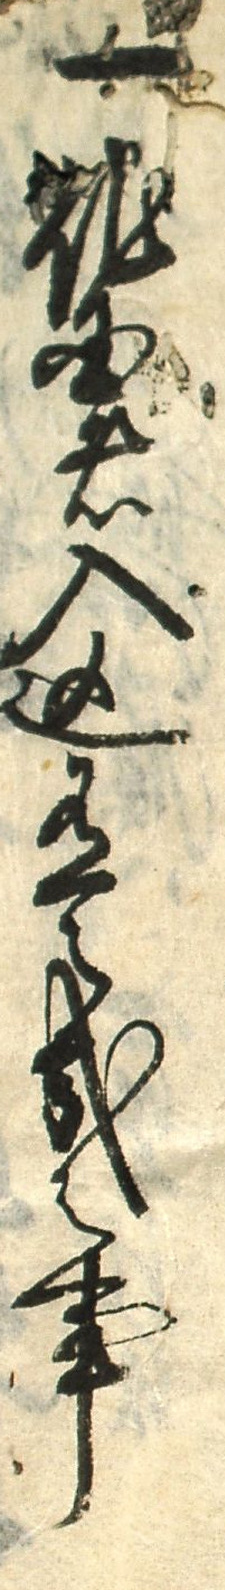一他国者入込有之哉之事
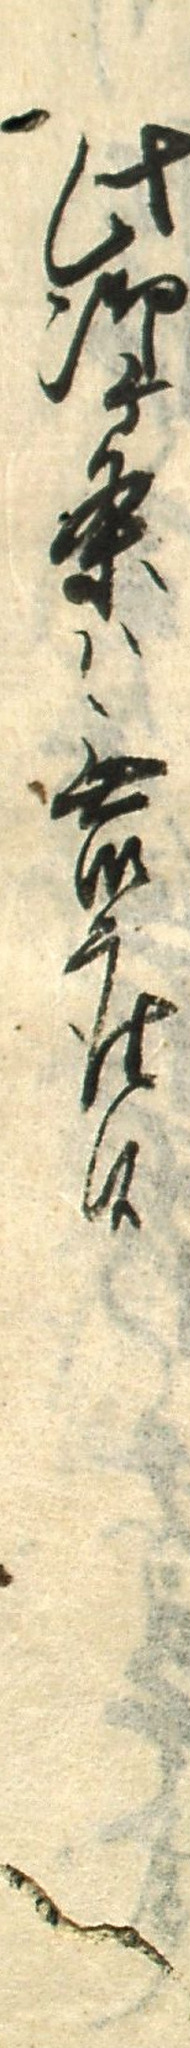此御ヶ条ハ無御座候
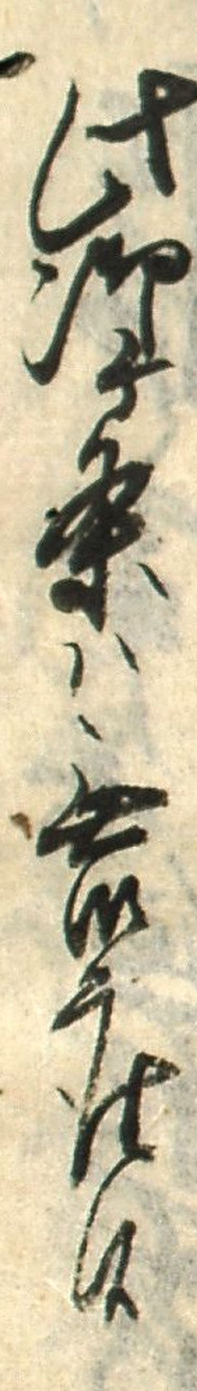此御ヶ条ハ無御座候
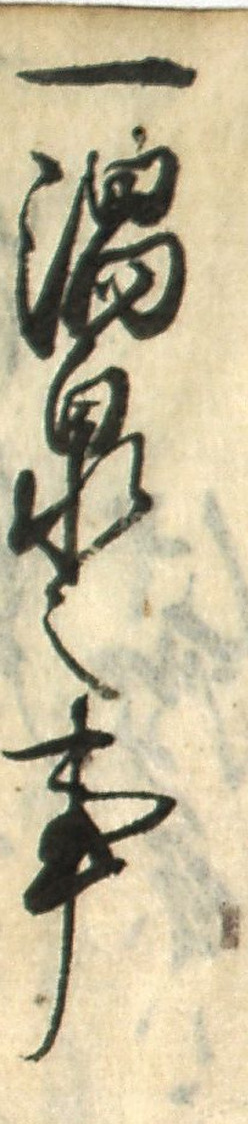一温泉之事
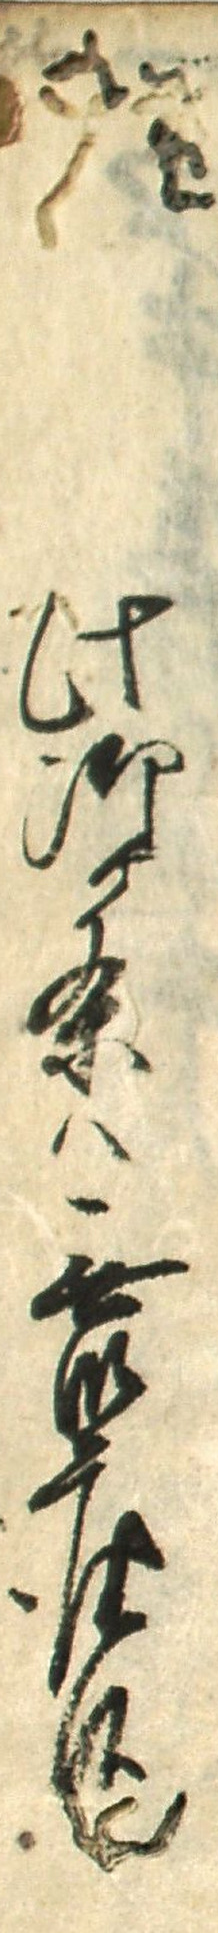此御ヶ条ハ無御座候
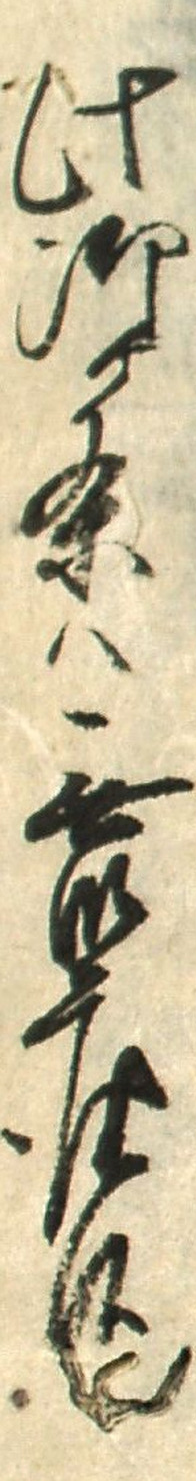此御ヶ条ハ無御座候

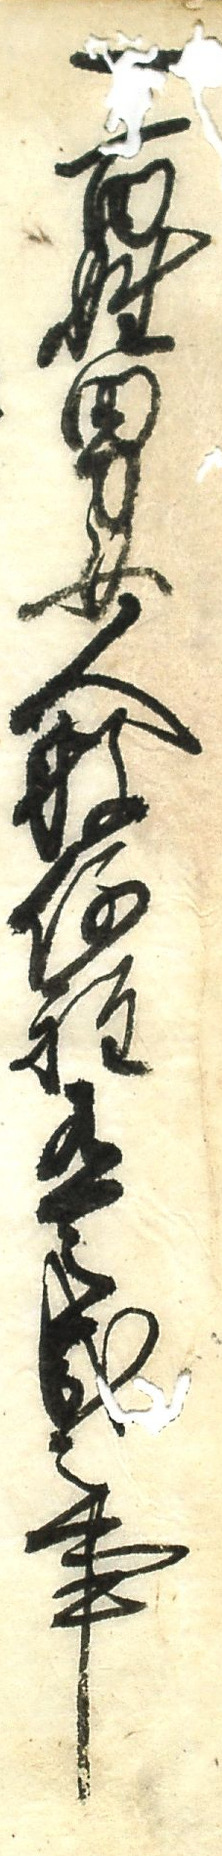一百姓男女人数何程有之哉之事
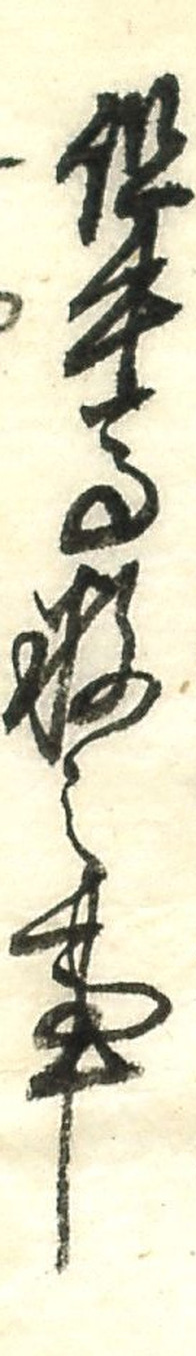但牛馬数之事
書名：御ヶ条ヲ以被仰附株々申上帳（早渕村控）
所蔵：鳴門教育大学 Naruto University of Education
